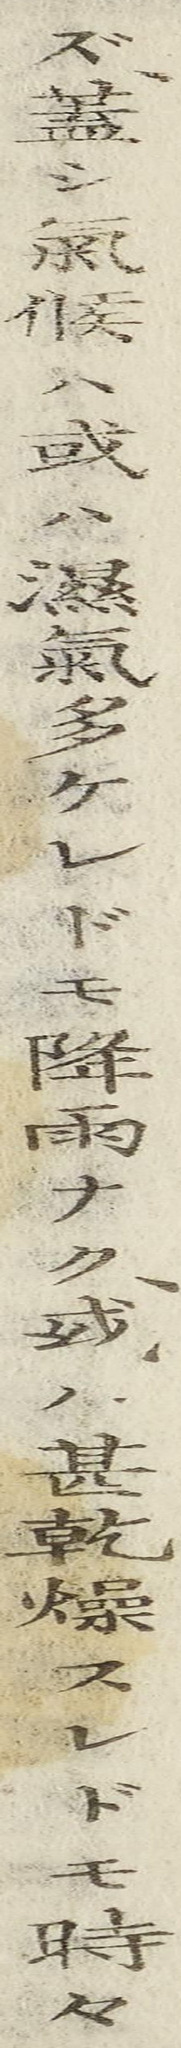ズ、蓋シ気候ハ或ハ湿気多ケレドモ降雨ナク、或ハ甚乾燥スレドモ時々

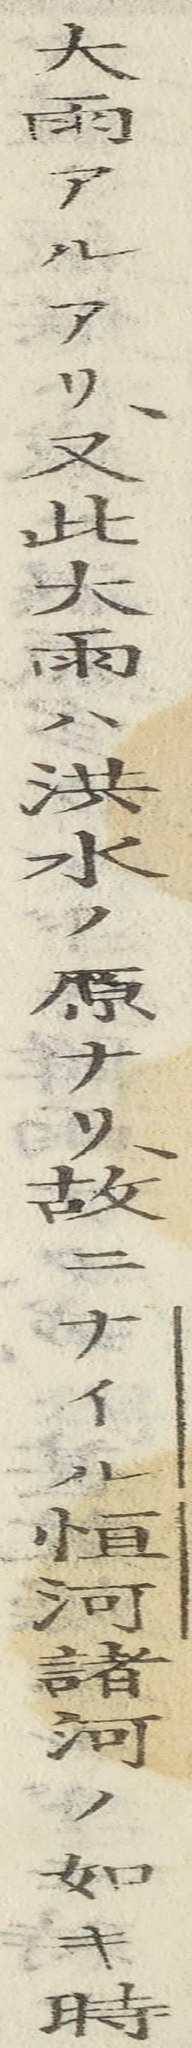大雨アルアリ、又此大雨ハ洪水ノ原ナリ、故ニナイル恒河諸河ノ如キ時
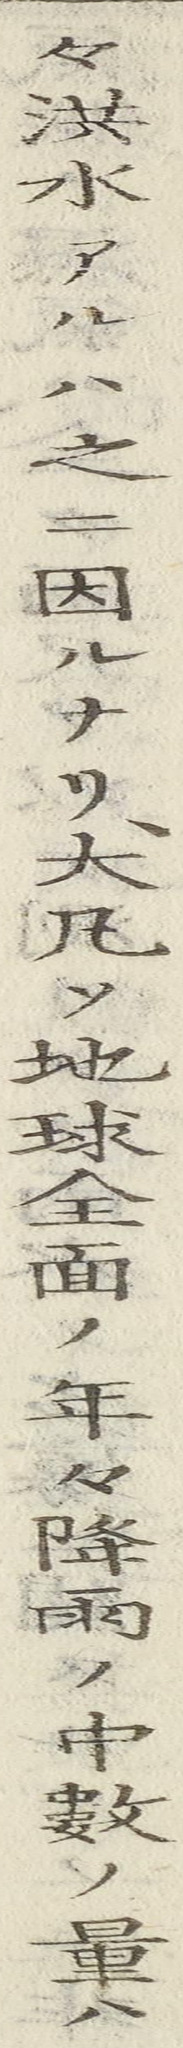々洪水アルハ之ニ因ルナリ、大凡ソ地球全面ノ年々降雨ノ中数ノ量ハ
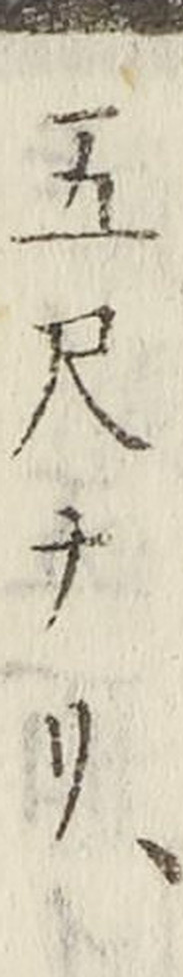五尺ナリ、
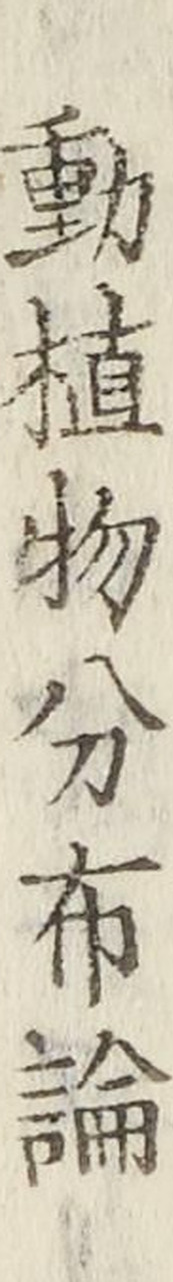動植物分布論
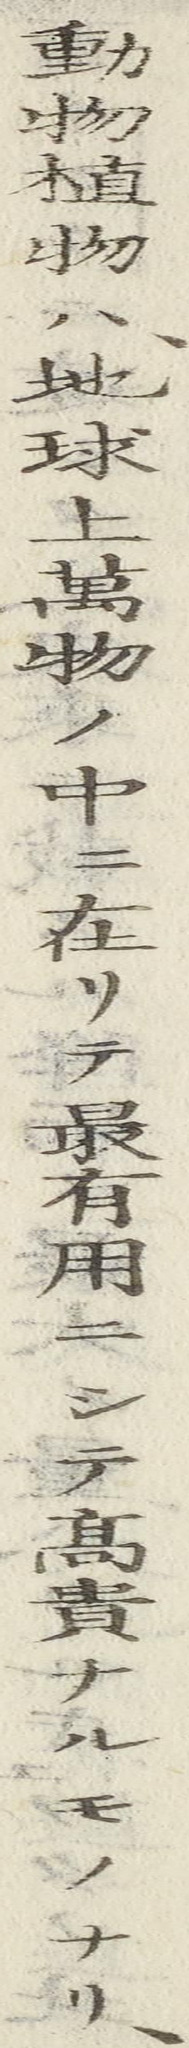動物植物ハ、地球上万物ノ中ニ在リテ最有用ニシテ高貴ナルモノナリ、
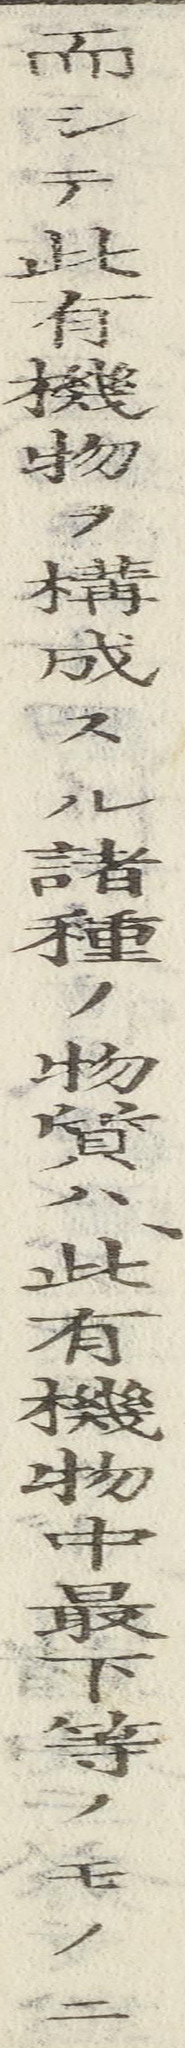而シテ此有機物ヲ構成スル諸種ノ物質ハ、此有機物中最下等ノモノニ
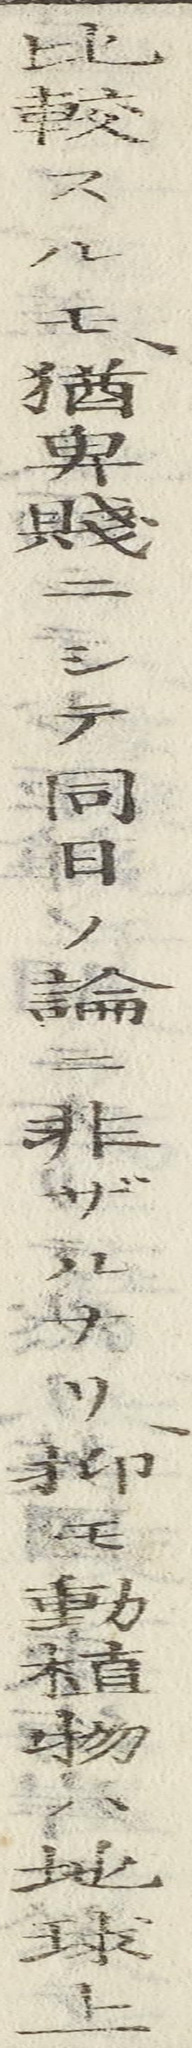比較スルモ、猶卑賎ニシテ同日ノ論ニ非ザルナリ、抑モ動植物ハ地球上
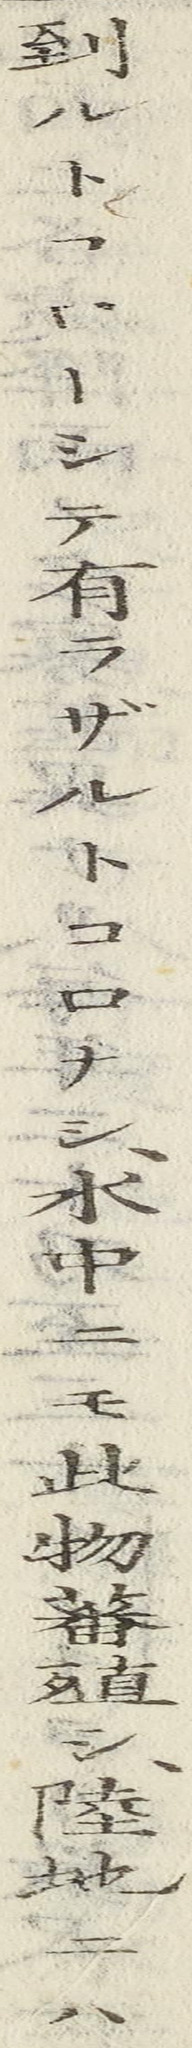到ルトコロトシテ有ラザルトコロナシ、水中ニモ此物蕃殖シ、陸地ニハ
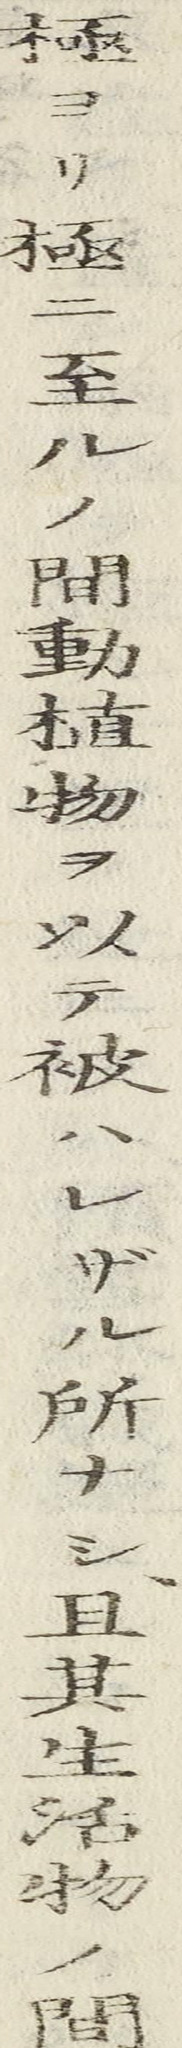極ヨリ極ニ至ルノ間動植物ヲ以テ被ハレザル所ナシ、且其生活物ノ間
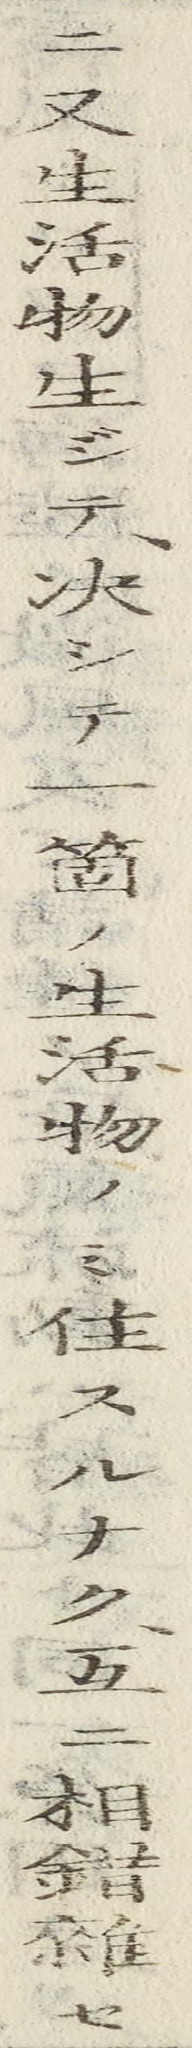ニ又生活物生ジテ、決シテ一箇ノ生活物ノミ住スルナク、互ニ相錯雑セ
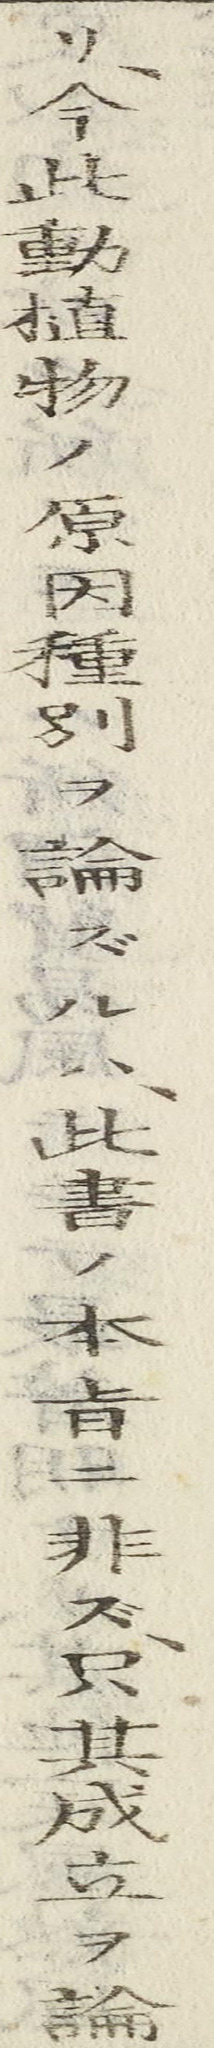リ、今此動植物ノ原因種別ヲ論ズルハ、此書ノ本旨ニ非ズ、只其成立ヲ論
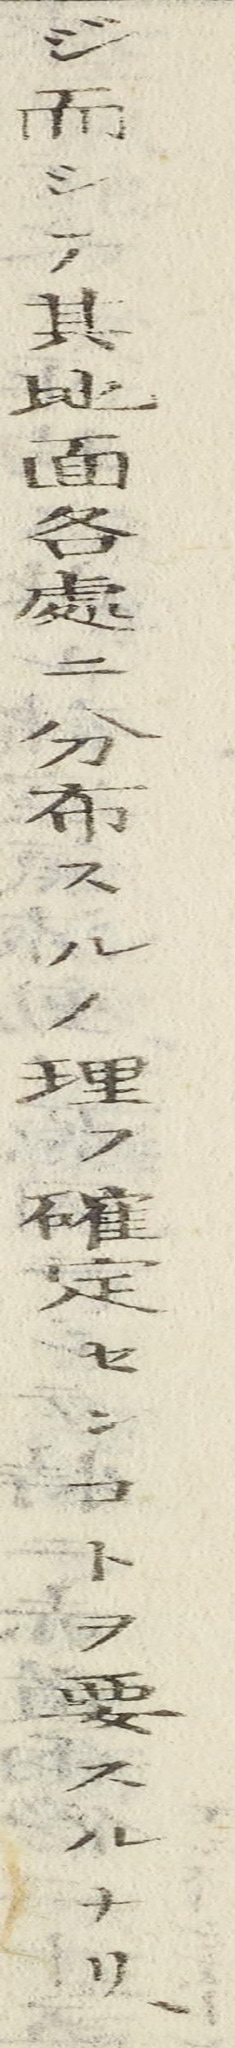ジ而シテ其地面各処ニ分布スルノ理ヲ確定センコトヲ要スルナリ、
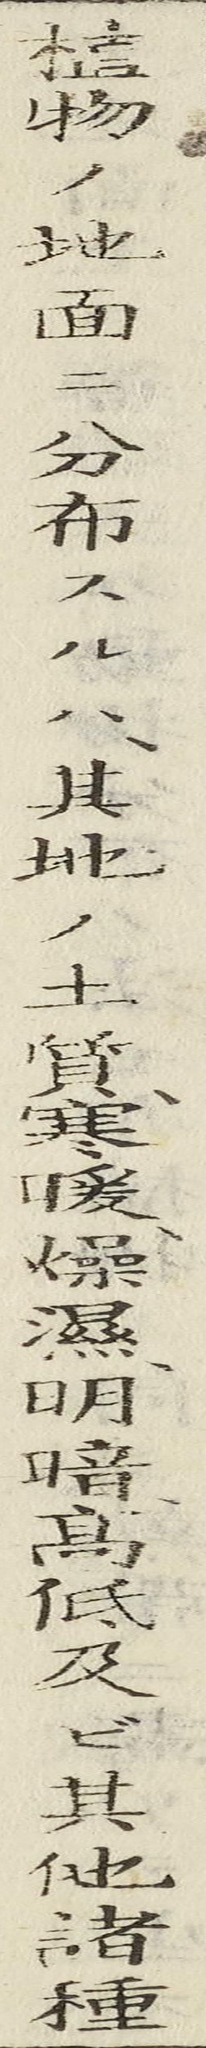植物ノ地面ニ分布スルハ、其地ノ土質、寒暖、燥湿、明暗、高低及ビ其他諸種
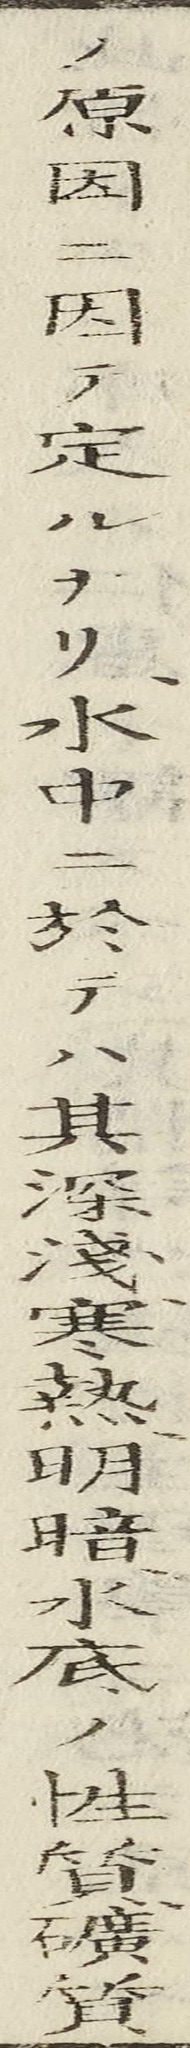ノ原因ニ因テ定ルナリ、水中ニ於テハ其深浅、寒熱、明暗、水底ノ性質、鉱質
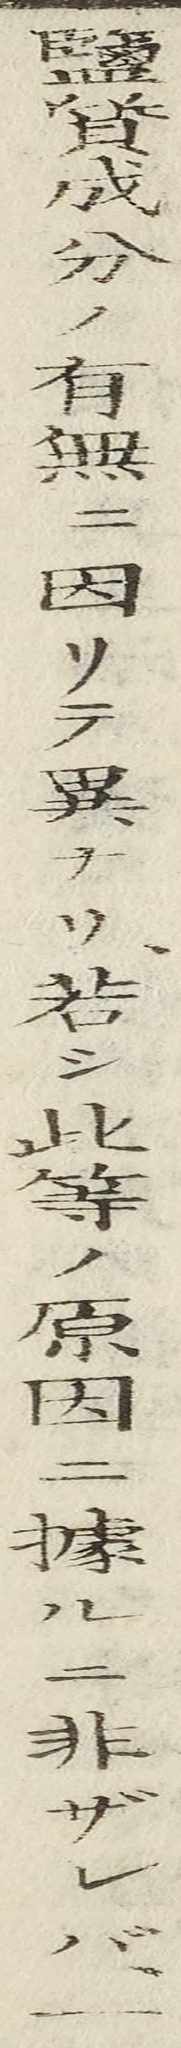塩質成分ノ有無ニ因リテ異ナリ、若シ此等ノ原因ニ拠ルニ非ザレバ、一
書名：百科全書　地文學　全
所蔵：東京大学地震研究所図書室 Earthquake Research Institute Library, The University of Tokyo, JAPAN
